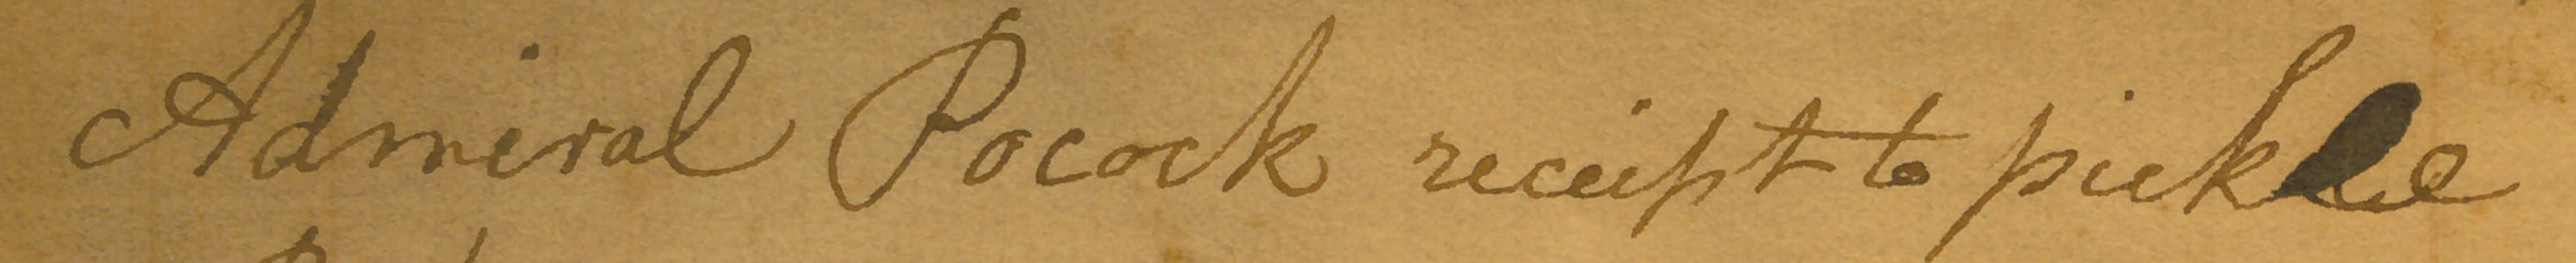Admiral Pocock receipt to pickle
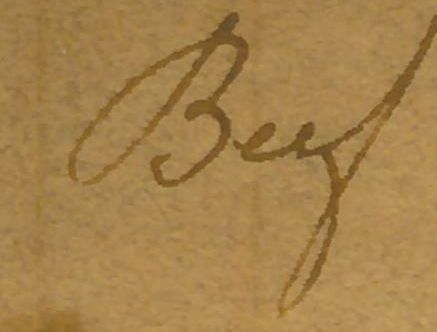Beef
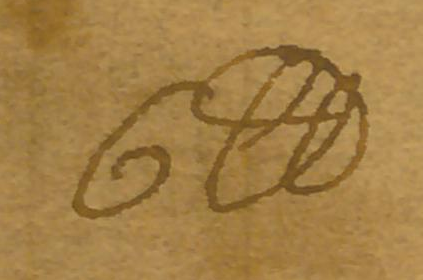6 lb
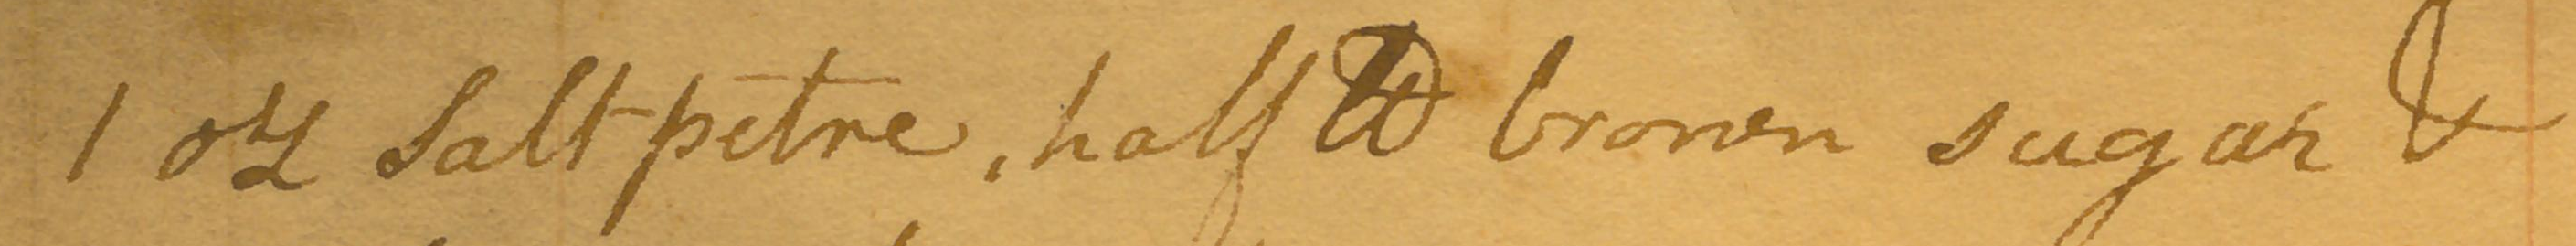1 oz Saltpetre, half lb brown sugar &
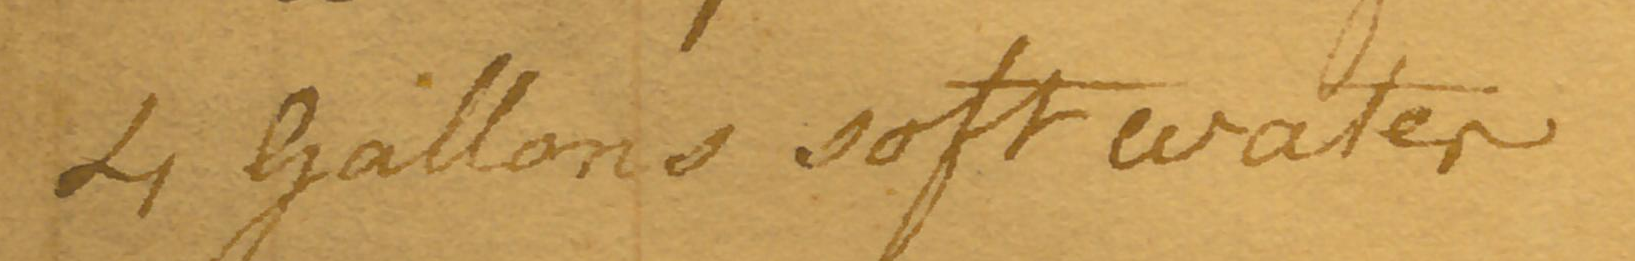4 Gallons soft water
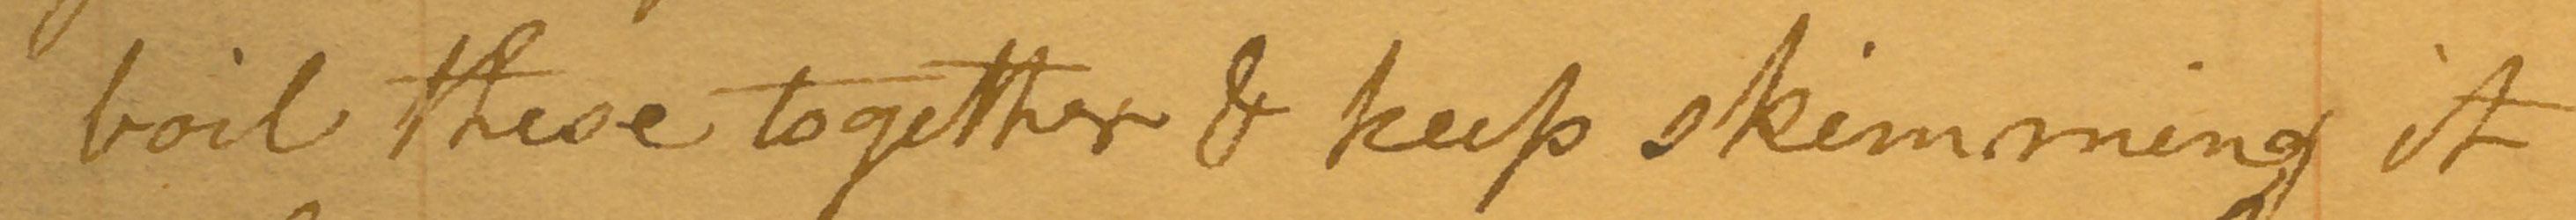boil these together & keep skimming it
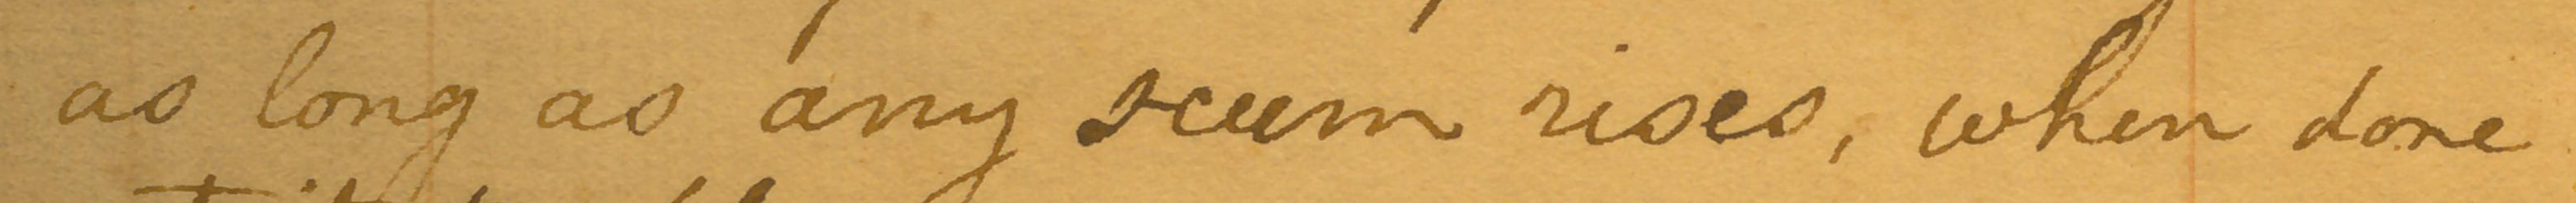as long as any scum rises, when done
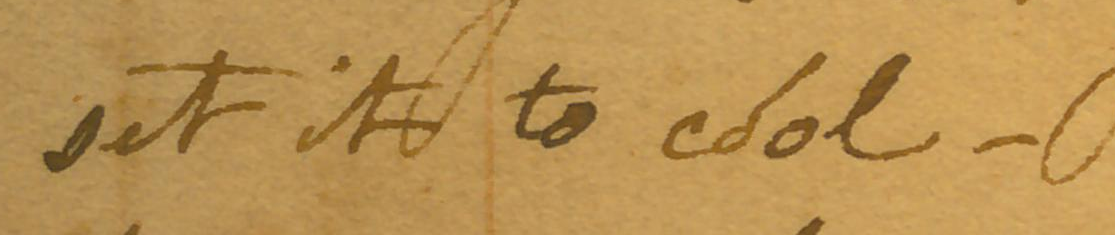set it to cool
